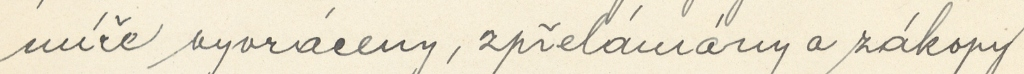míře vyvráceny, zpřelámány a zákopy
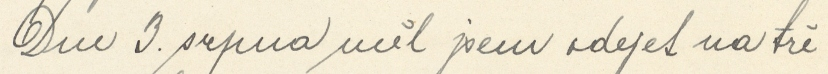Dne 3. srpna měl jsem odejet na tře-
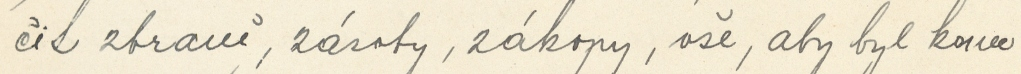čit zbraně, zásoby, zákopy, vše, aby byl konec
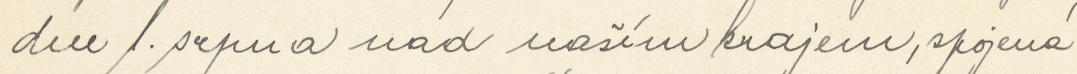dne 1. srpna nad naším krajem, spojená
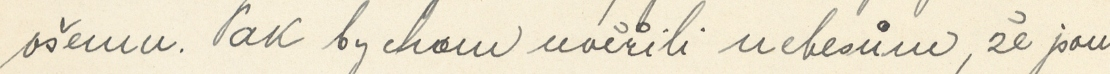všemu. Pak bychom uvěřili nebesům, že jsou
